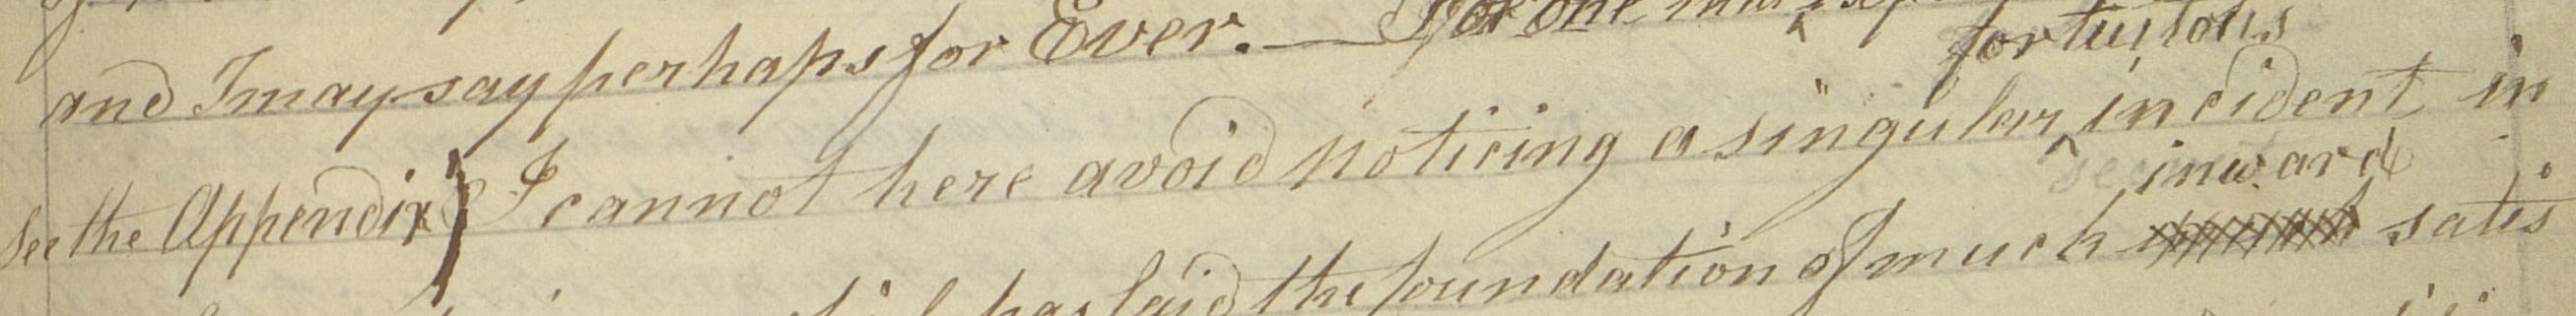See the Appendix) I cannot here avoid noticing a singular ^ incident in
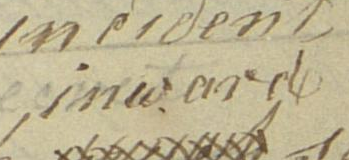inward
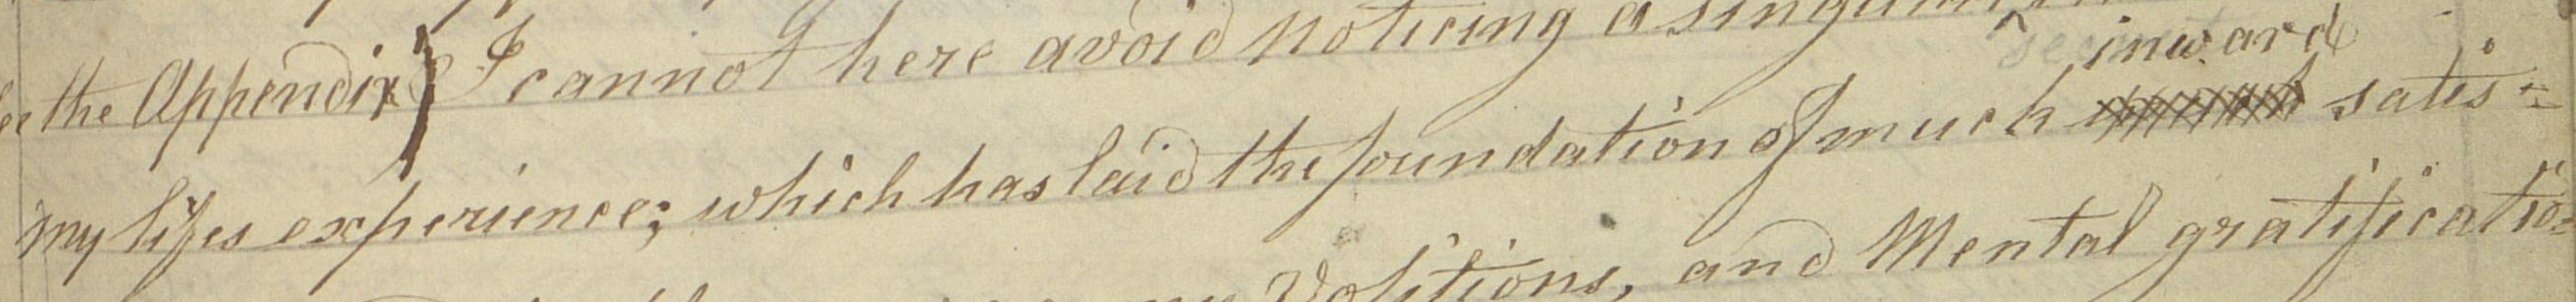my lifes experience; which has laid the foundation of much much satis-
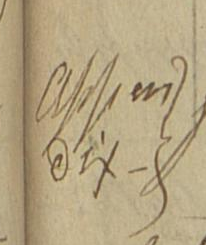Appen
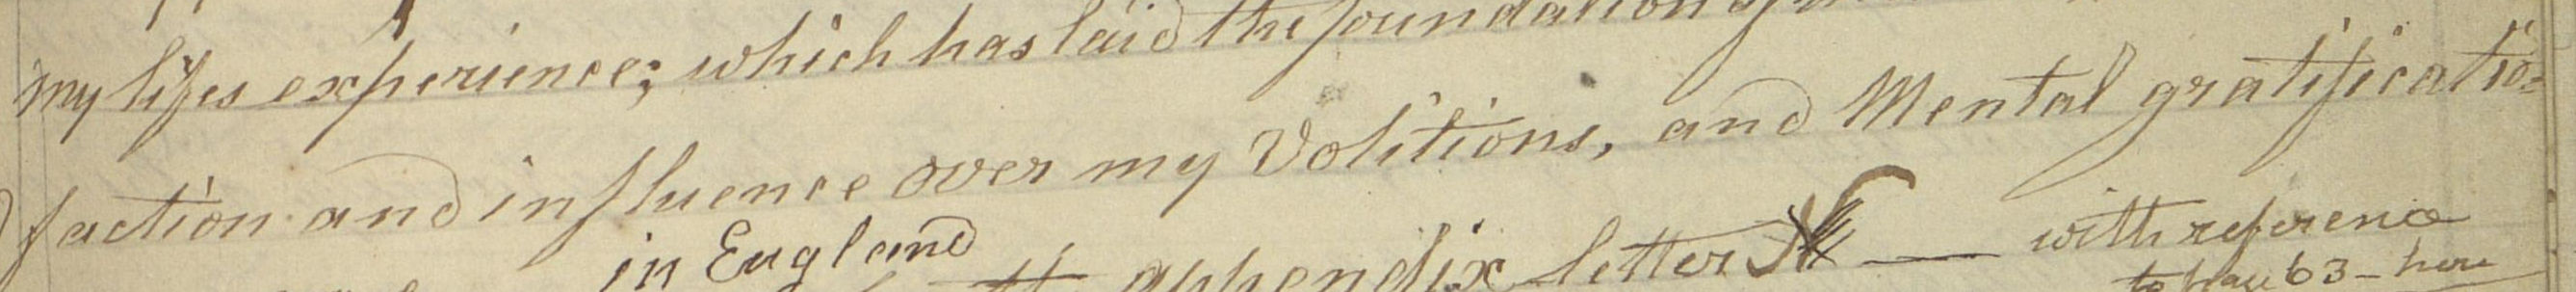-faction and influence over my Volitions, and Mental gratification
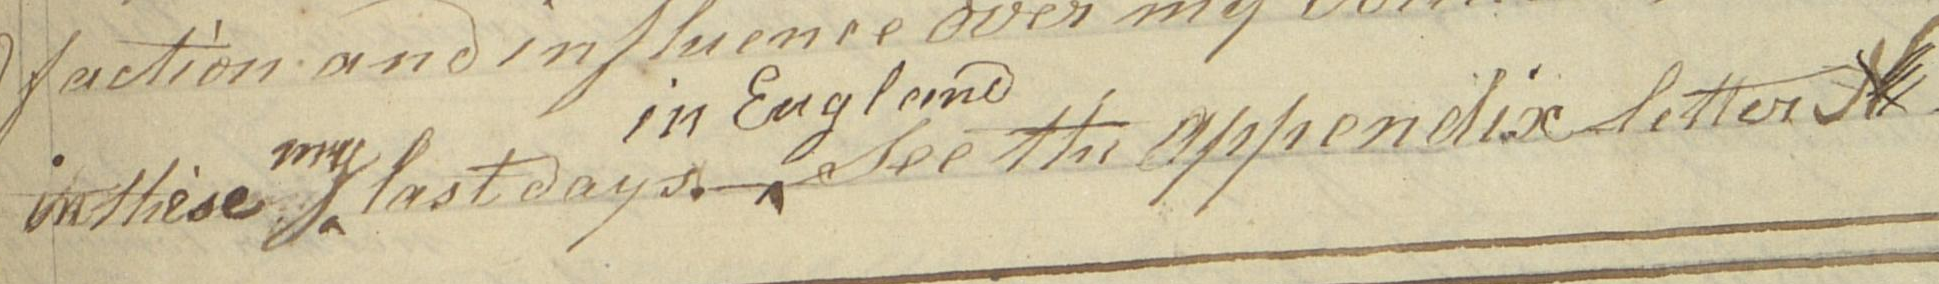in these ^ last days. ^ See the Appendix Letter N
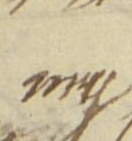my
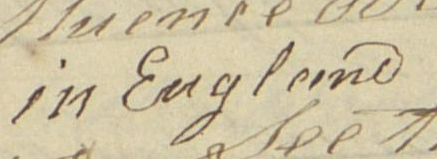in England
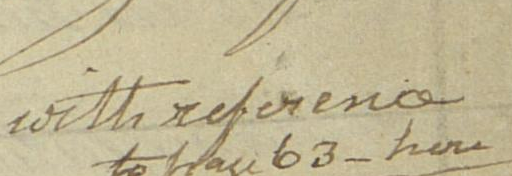with reference
